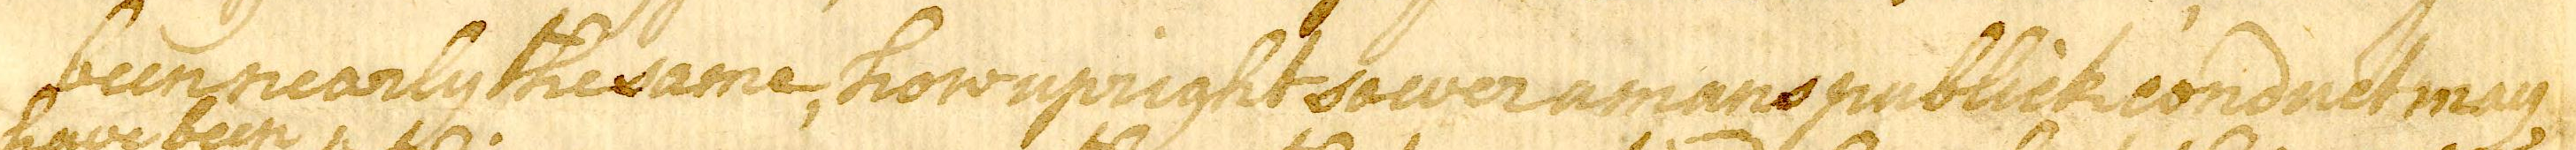been nearly the same, how upright so ever a mans publick conduct may
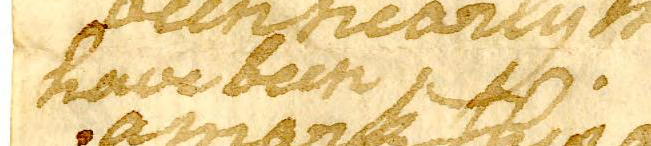have been
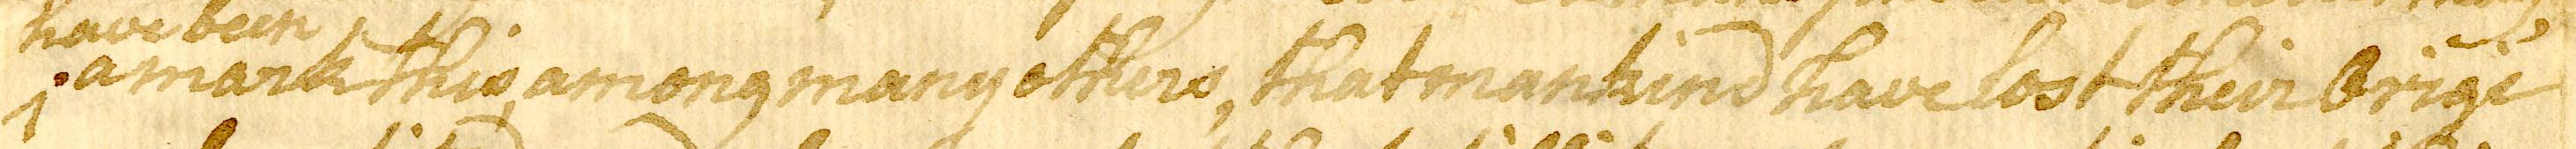^ a mark this, among many others, that mankinsd have lost their Origi
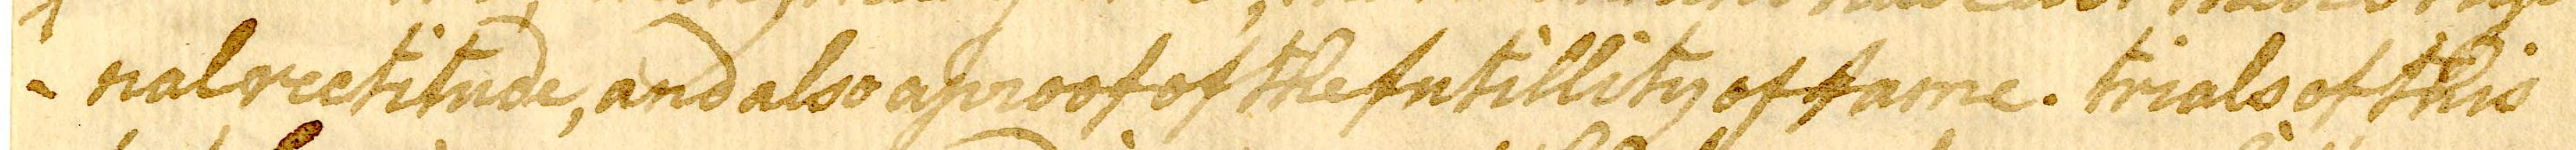-nal rectitude, and also a proof of the futillity of fame. trials of this
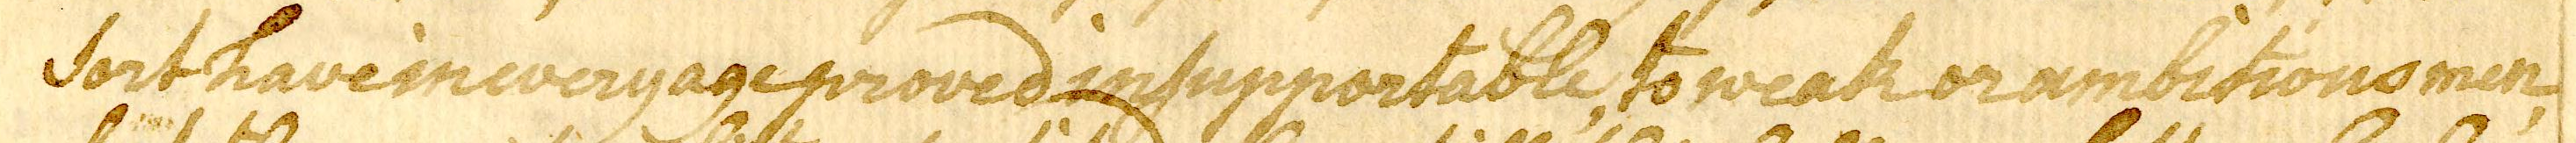sort have in every age proved insupportable, to weak or ambitious men,
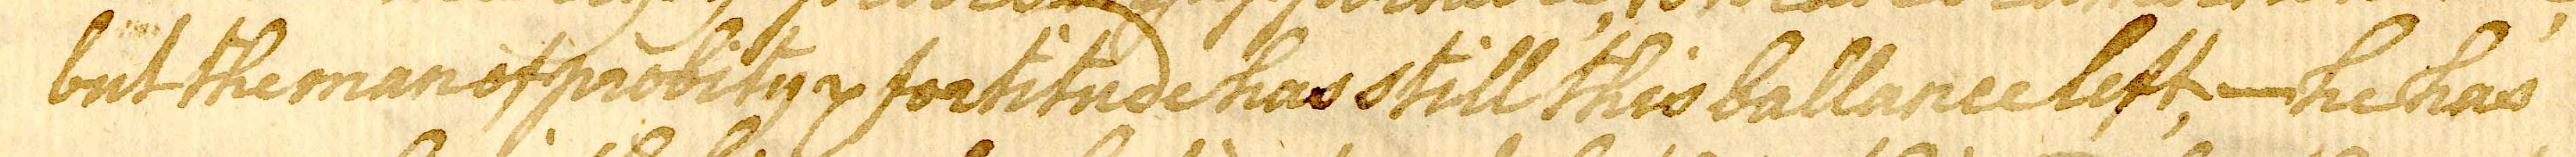but the man of probity& fortitude has still this ballance left,- he has
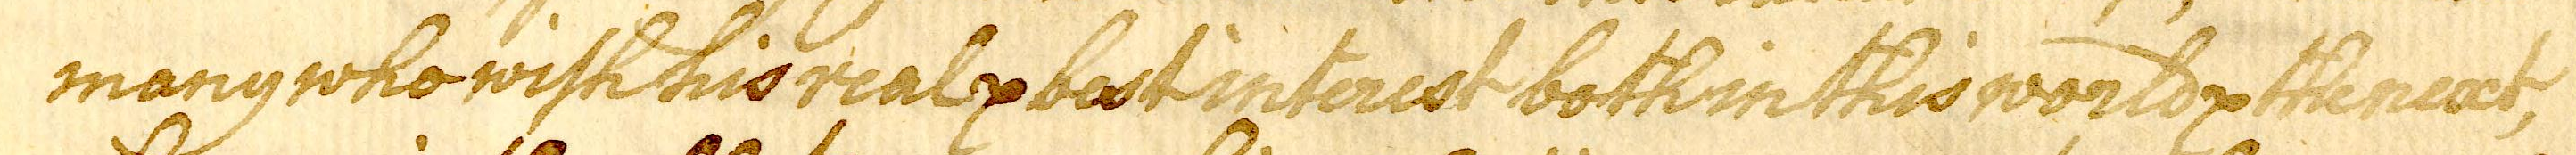many who with his real & best interest both in this world & the next,
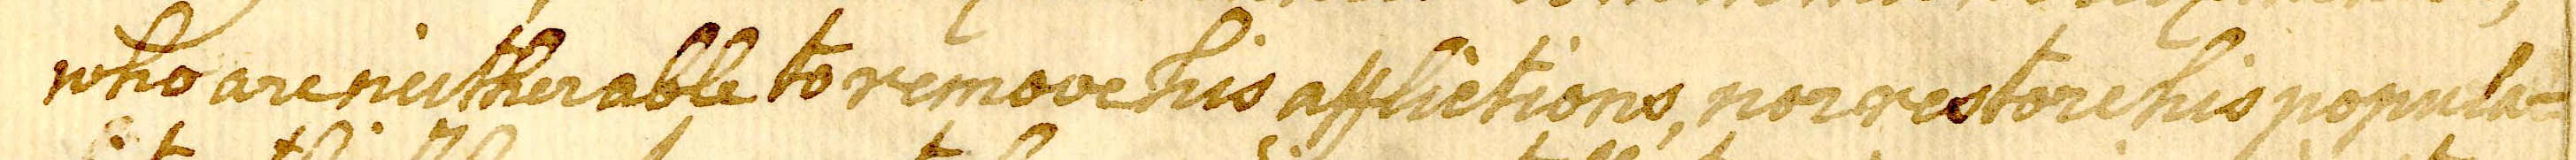who are neither able to remove his afflictions, nor restore his popula-
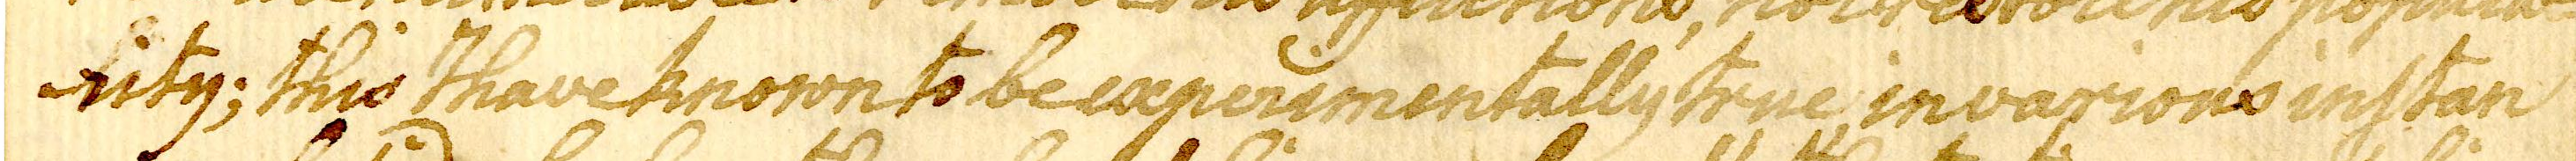rity; this I have known to be experimentally true, in various instan
